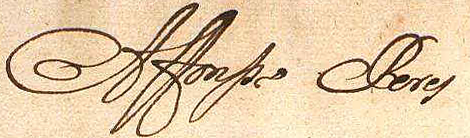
Affonsso Peres
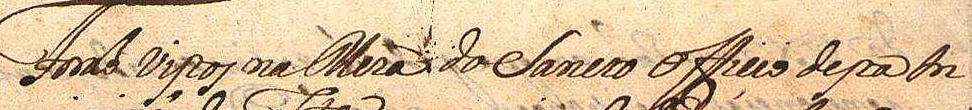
Foraõ vistos na Meza do Sancto officio dessa In
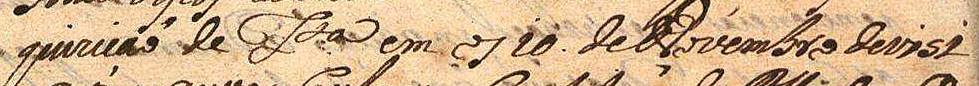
quizição de Lxa. em os i0. de Novembro de i75i
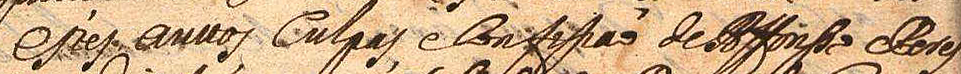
estes auttos, Culpas, e confisssaõ de Affonsso Peres
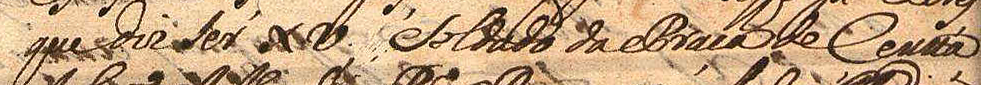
que diz ser x v., Soldado da Praça de Ceutta,
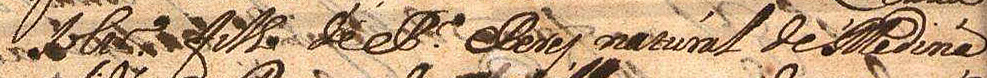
soltr.o filho de P.o Peres natural de Medina
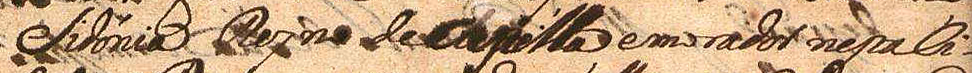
Sidónia Reyno de Castilla, e morador nesta Ci
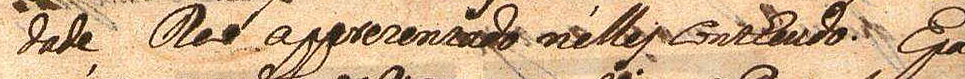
dade, Reo apprezentado nelles contheudo. E pa
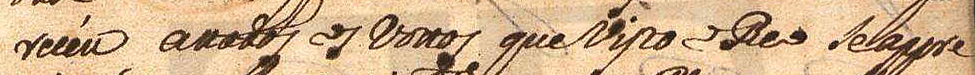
receu a ttodos os vottos que visto o Reo se appre
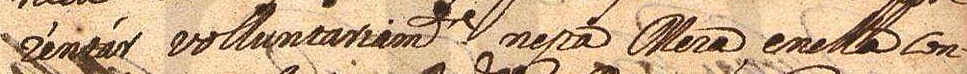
zentar volluntariamte nesta Meza, e nella con
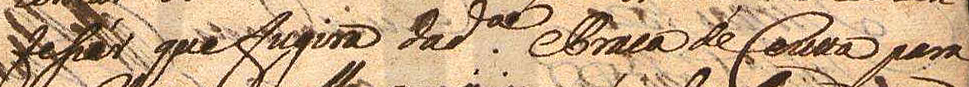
fessar que fugira da d.a Praça de Ceutta para
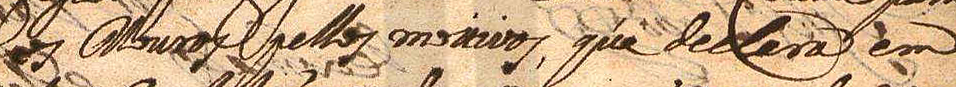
os Mouros pellos mottivos, que declara em
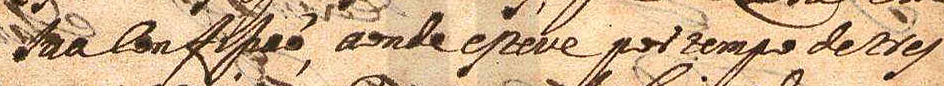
sua confissaõ, aonde esteve por tempo de tres
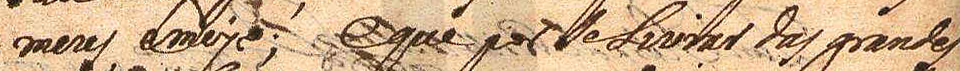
mezes e meyo; e que por se Livrar das grandes
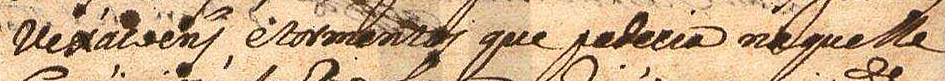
vexaçoens, e tormentos que padecia naquelle
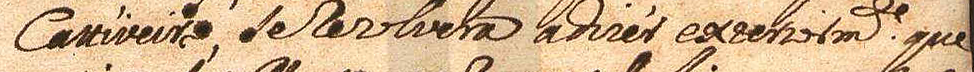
Cattiveiro, se Rezolvera a dizer exteriorm.te que
